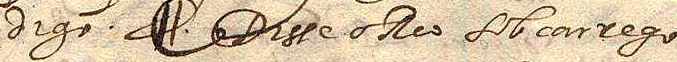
digo ⁋ Disse o Reo sob carrego
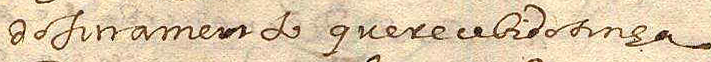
do Iuramento que recebido tinha
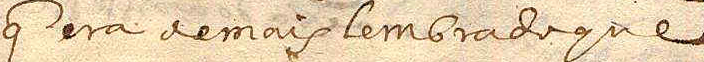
q̄ era de mais lembrado que
